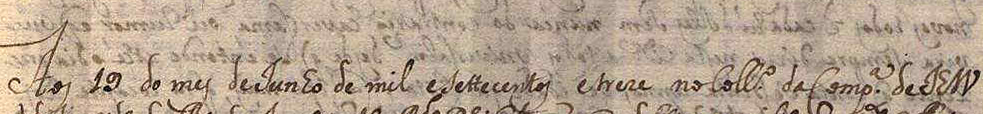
Aos 19 do mes de Iunho de mil e settecentos, e treze no Coll.o da Comp.a de IESV
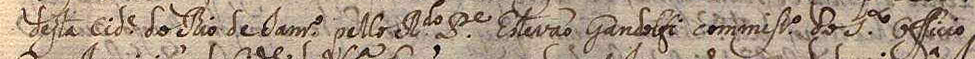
desta Cid.e do Rio de Ianr.o pello R.do P.e Estevaõ Gandolfi commisr.o do S.to Officio
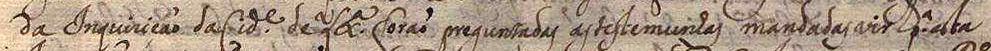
da Inquizição da Cid.e de Lx.a foraõ preguntadas as testemunhas mandadas vir p.a esta
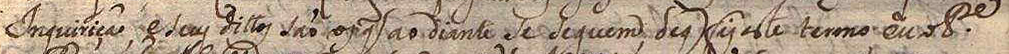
Inquiriçaõ, e seus dittos saõ os q̄ ao diante se seguem, de q̄ fis este termo eu o P.e
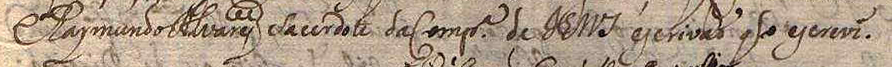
Raymundo Alvares Sacerdote da Comp.a de IESVS escrivaõ q̄ o escrevi.
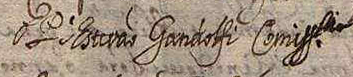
o P Estevaõ Gandolfi Comiss.io
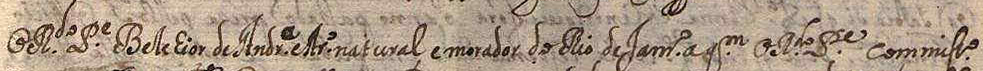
O R.o P.e Belchior de Andr.e Ar.o natural, e morador do Rio de Janr.o a q.m o R.o P.e commisr.o
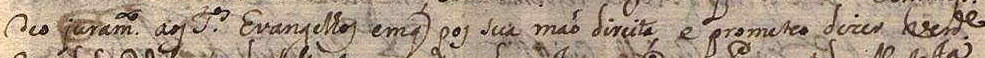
deo juram.to aos S.tos Evangelhos em q̄ pos sua maõ direita, e prometeo dizer verd.e
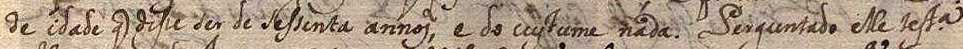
de idade q̄ disse ser de sessenta annos, e do custume nada. Perguntado elle test.a
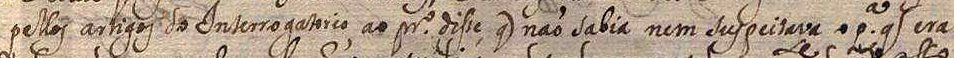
pellos artigos do Interrogatorio, ao pr.o disse, q̄ naõ sabia nem suspeitava o p.a q̄ era
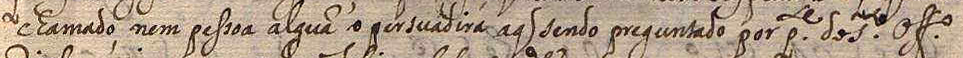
chamado nem pessoa alguā o persuadira a q̄ sendo preguntado por p.te do s.to Off.o
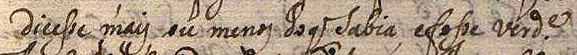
dicesse mais ou menos do q̄ Sabia, e fosse verd.e
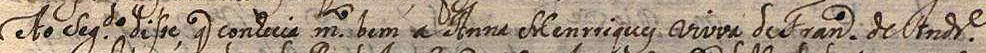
Ao Seg.do disse, q̄ conhecia m.to bem a Anna Henrriques vivva de Fran.co de Andr.e
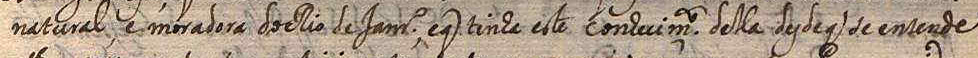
natural, e moradora do Rio de Janr.o, e q̄ tinha este conhecim.to della desde q̄ se entende
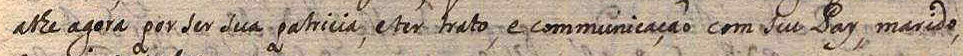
athe agora por ser sua patricia, e ter trato, e communicação com seu Pay, marido,
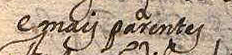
e mais parentes
